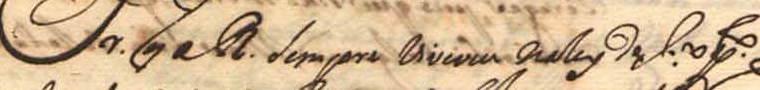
Pr. q̄ a R. sempre viveveu na ley de J: xp.to
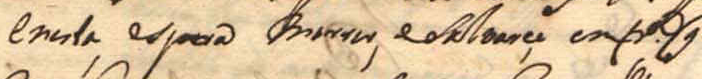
e nesta, espera morrer, e Salvarce em fr.a q̄
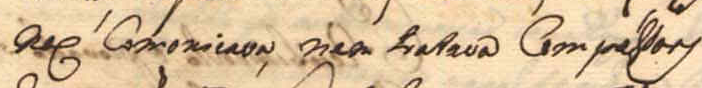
naõ Comonicava, nem tratava Com pessoas
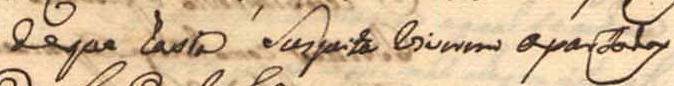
de que hasta suspeita viverem apartadas
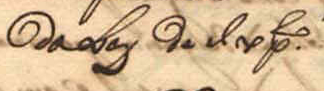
da Ley de I xpto.
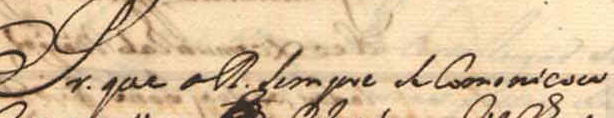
Pr. que o R. sempre se Comonicou
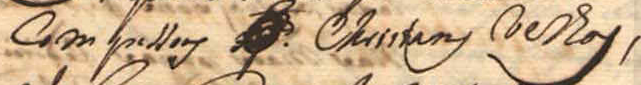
Com pessoas _ Christans velhos,
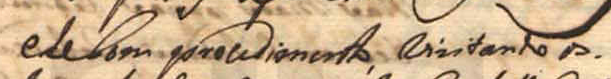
e de bom procedimento, vizitando os.
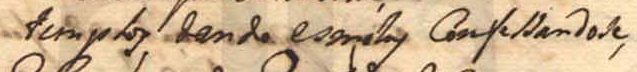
templos, dando esmolas Confessandose,
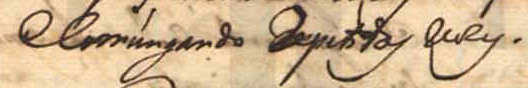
E Comungando Repetidas vezes.
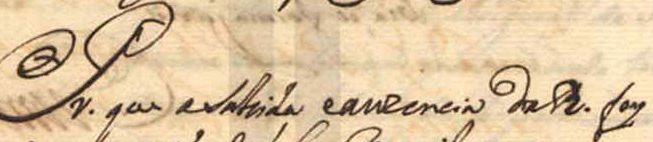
Pr. que a Sahida, e auzencia da R. foy
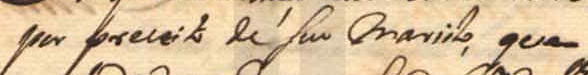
per preceito de seu Marido, que
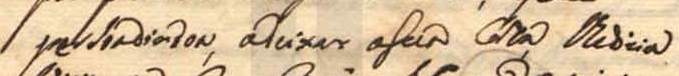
persoadindoa, a deixar a sua Caza lhe dizia
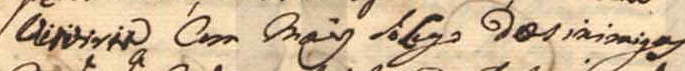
viviria Com Mais soCego dos inimigos
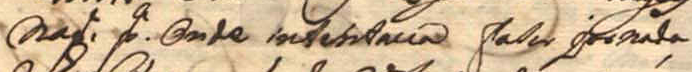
na p.e p.a Onde intentaua faser jornada
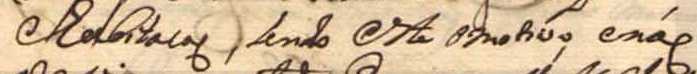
e habitaçaõ, sendo este o motivo, e naõ
